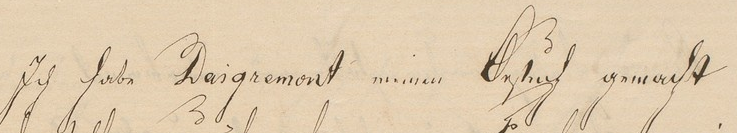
Ich habe Daigremont einen Besuch gemacht
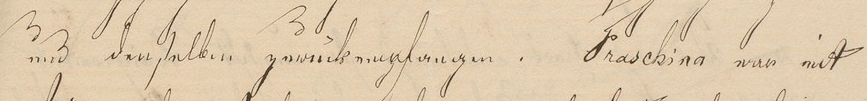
und denselben zurückempfangen. Fraschina war mit
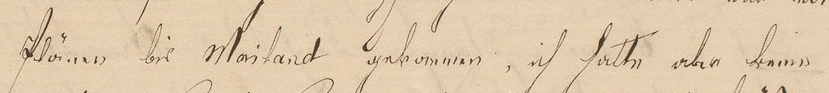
Plänen bis Mailand gekommen, ich hatte aber keine
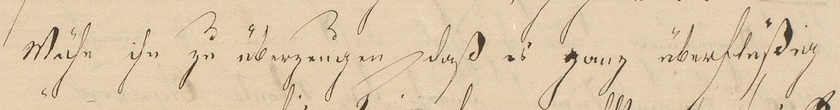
Mühe ihn zu überzeugen daß es ganz überflüßig
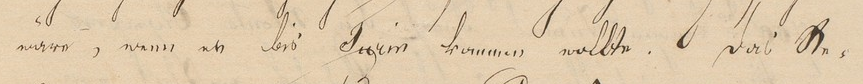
wäre, wenn er bis Turin kommen wollte. Das Re-
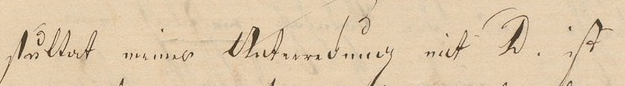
sultat meiner Unterredung mit D. ist
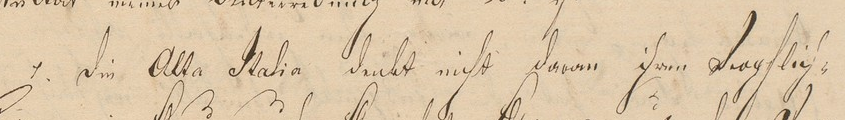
1. Die Alta Italia denkt nicht daran ihren Verpflich-
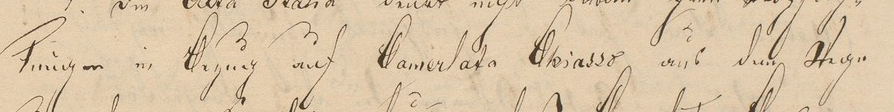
tungen in Bezug auf CamerlataChiasso aus dem Wege
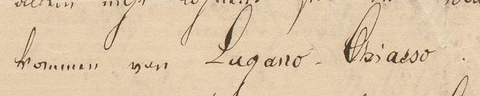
kommen von Lugano–Chiasso
